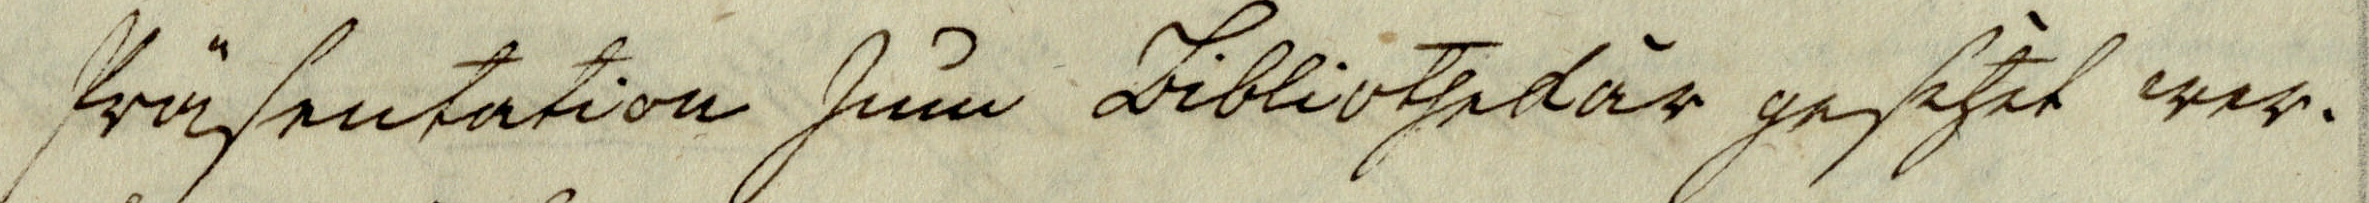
Präsentation zum Bibliothekär gesetzt wer¬
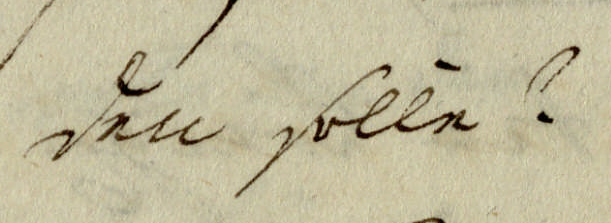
den solle?
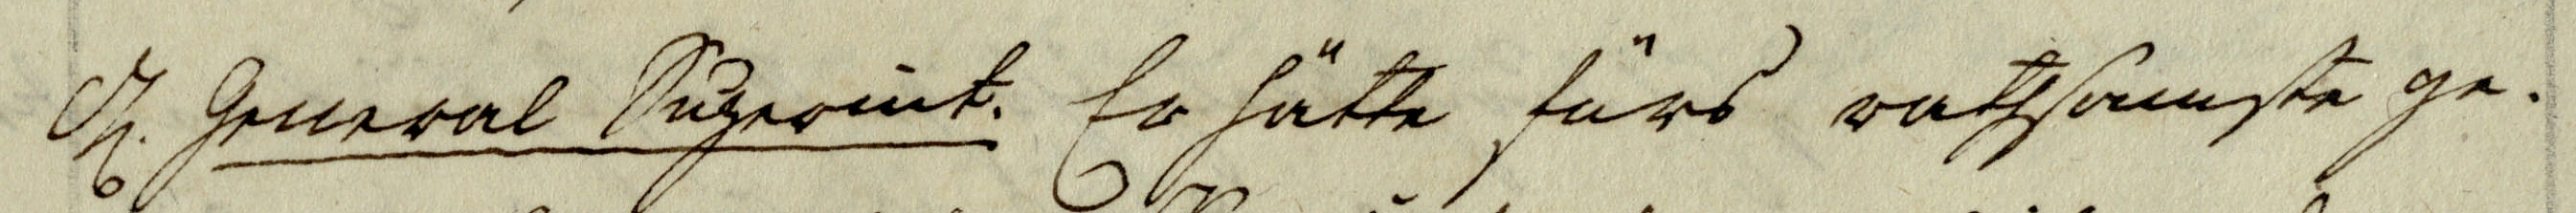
dh. General Superint. Er hätte fürs rathsamste ge¬
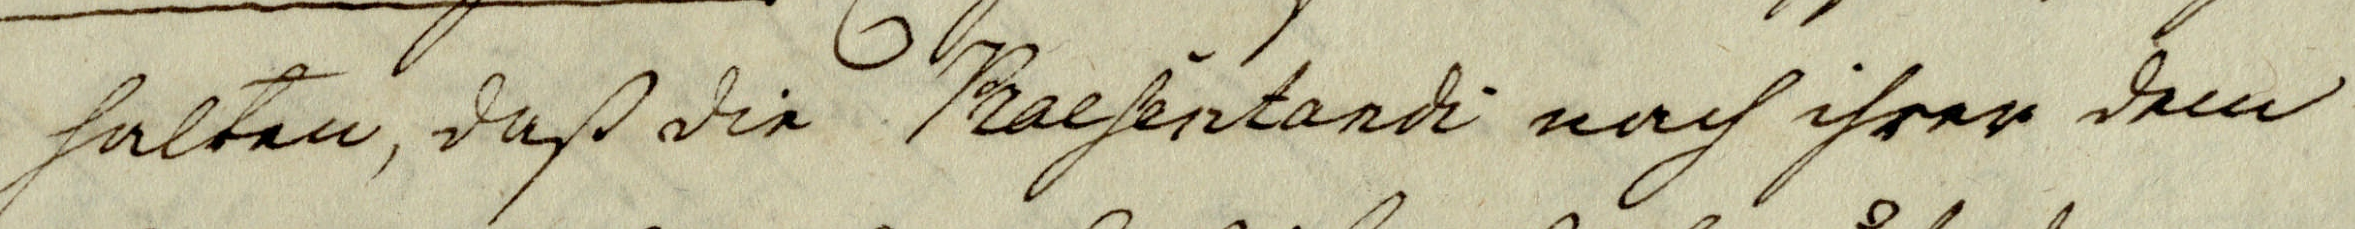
halten, daß die Praesentandi nach ihrer dem
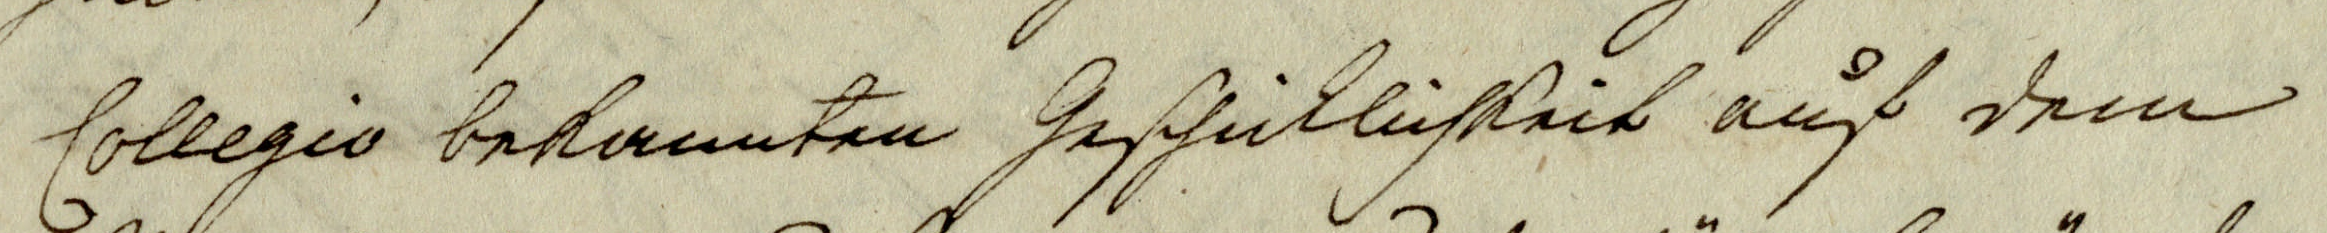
Collegio bekannten Geschicklichkeit auf dem
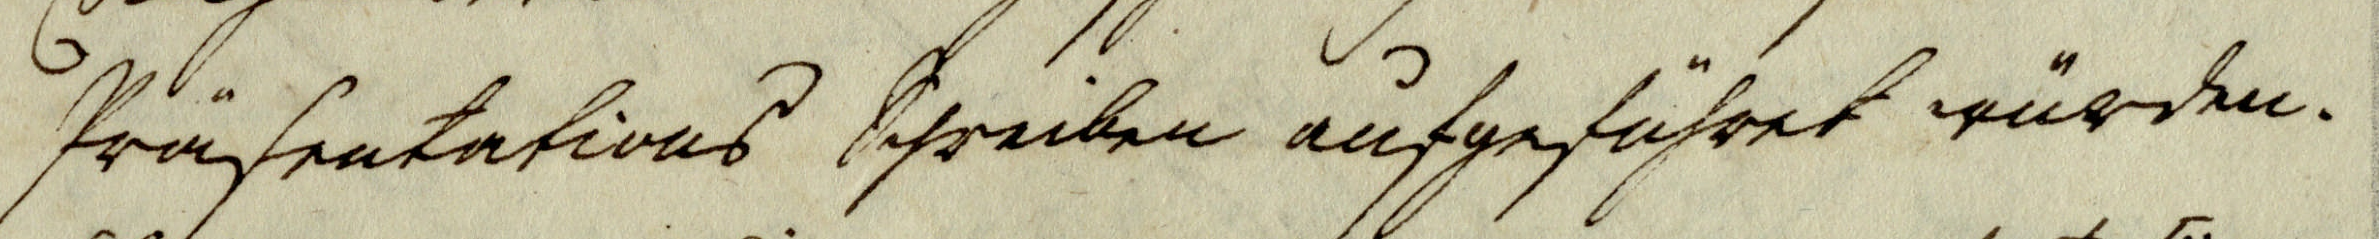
Präsentations Schreiben aufgeführet würden.
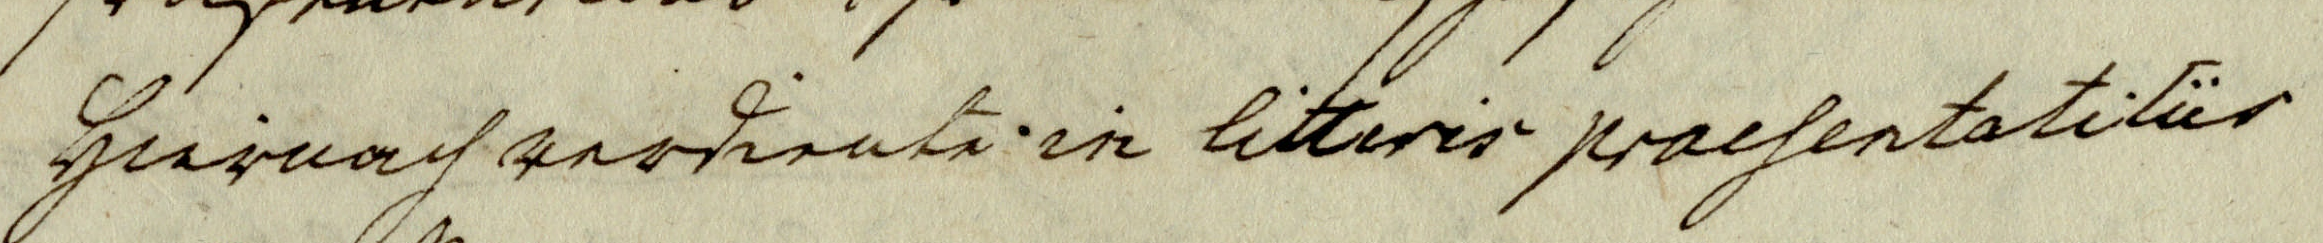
Hiernach verdiente in litteris praesentatitiis
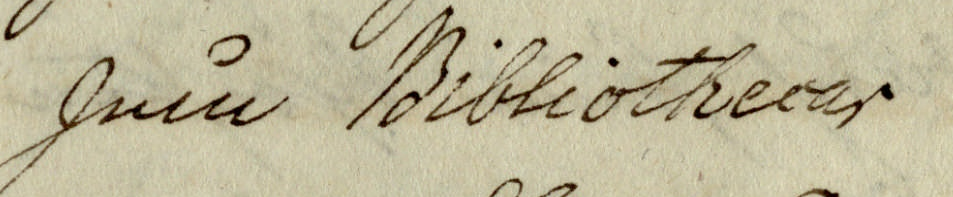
zum Bibliothecar
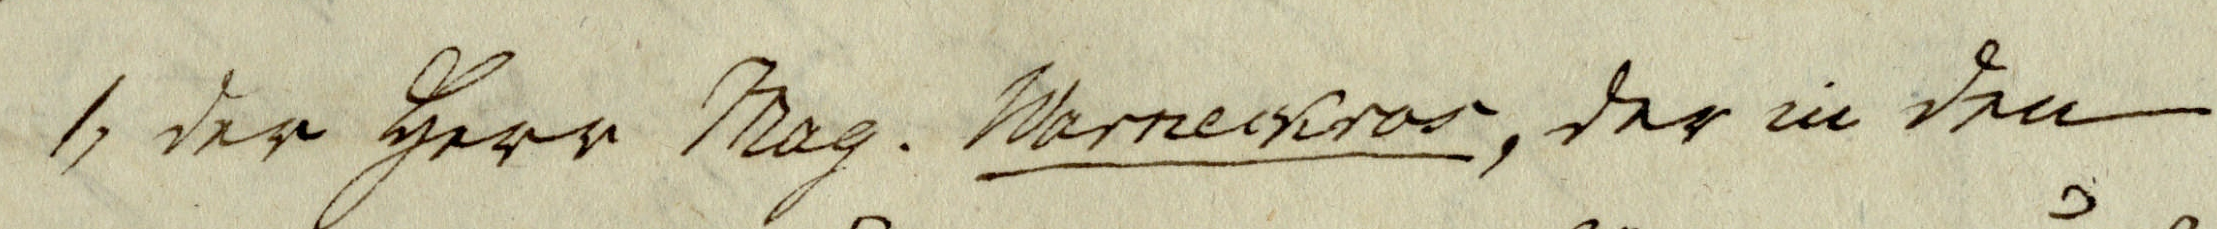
1., der Herr Mag. Warneckros, der in den
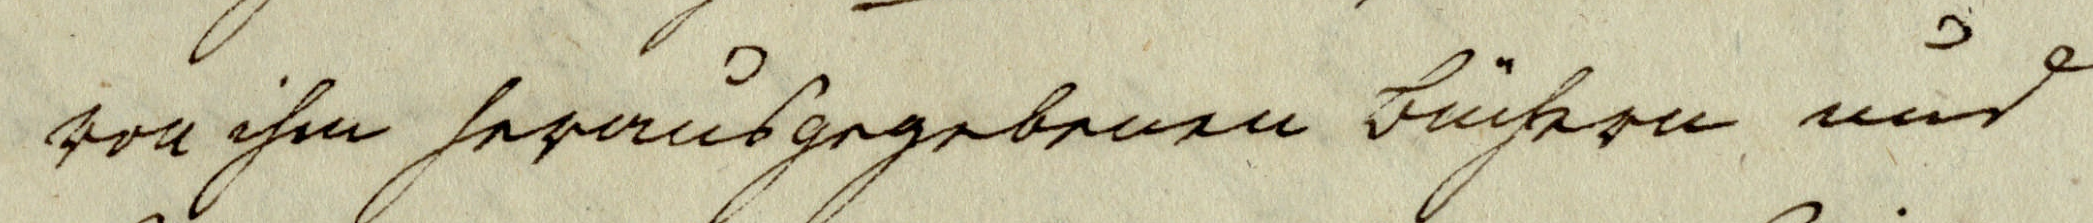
von ihm herausgegebenen Büchern und
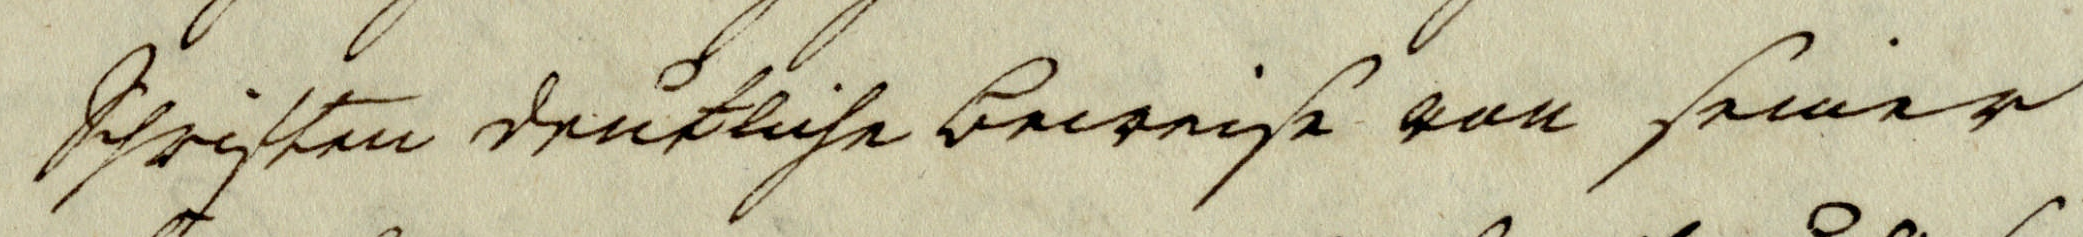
Schriften deutliche Beweise von seiner
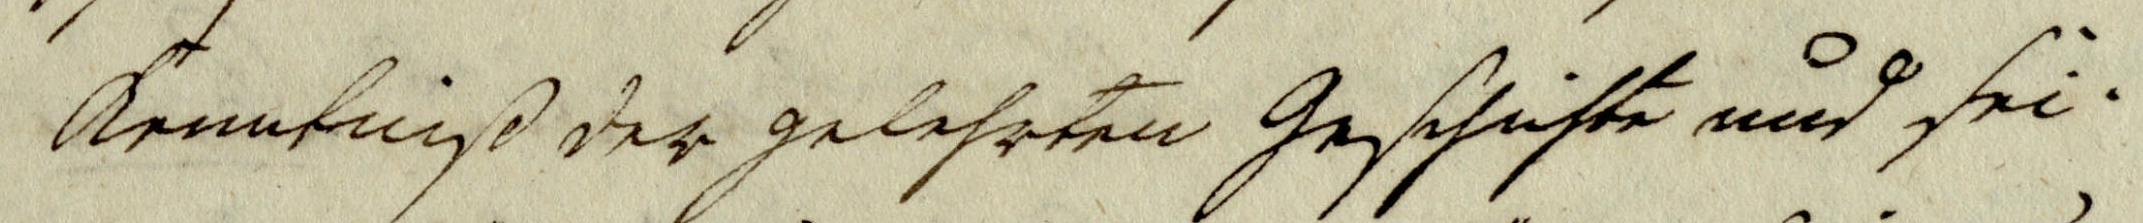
Kenntniß der gelehrten Geschäfte und sei¬
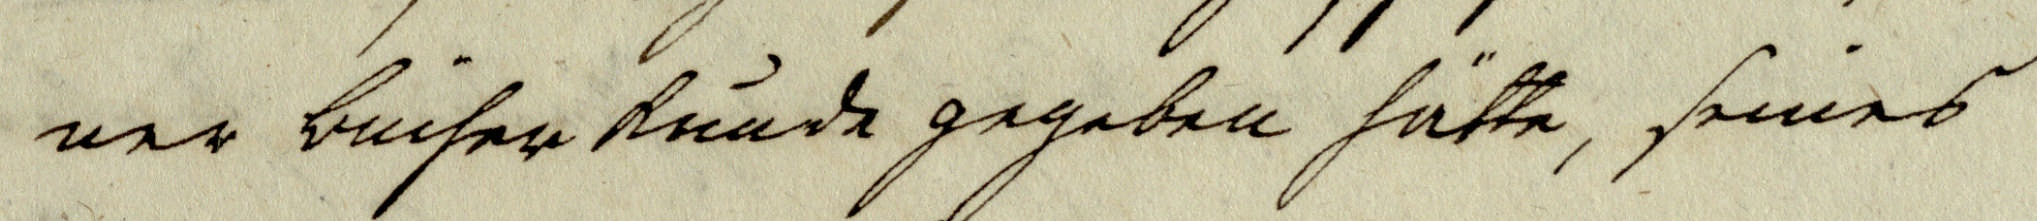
ner Bücher Kunde gegeben hätte, seines
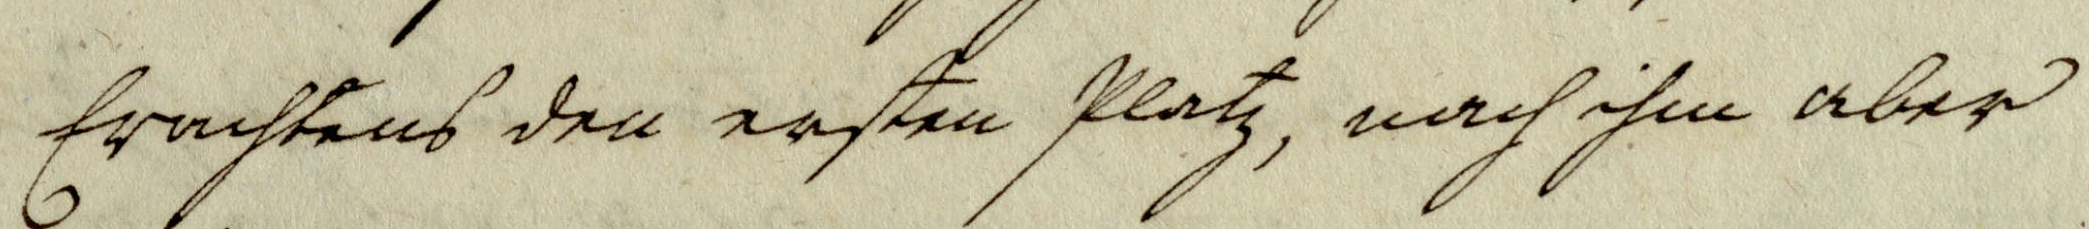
Erachtens den ersten Platz, nach ihm aber
